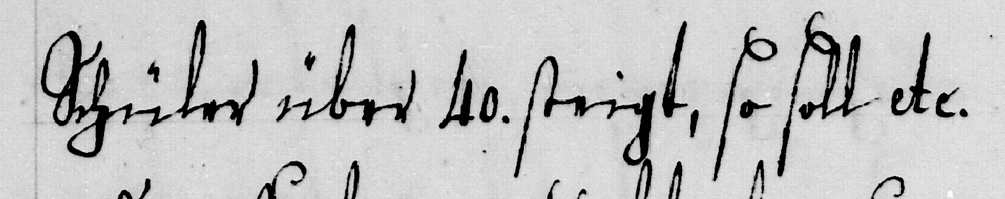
Schüler über 40. steigt, so soll e¬
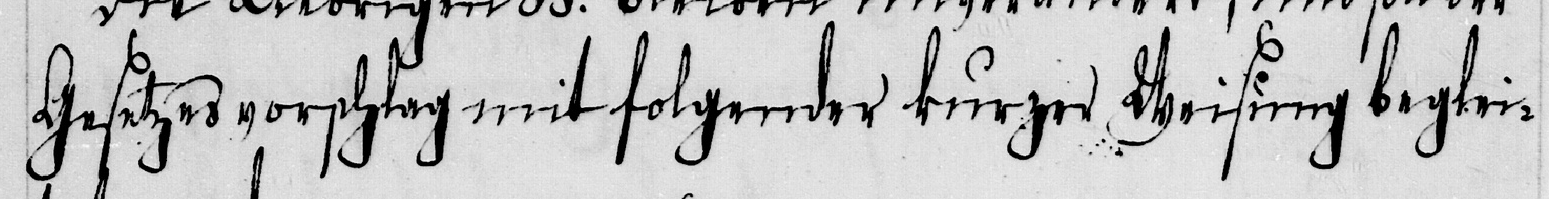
Gesetzesvorschlag mit folgender kurzer Weisung beglei¬
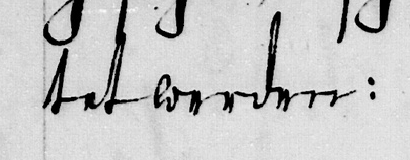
tet werden:
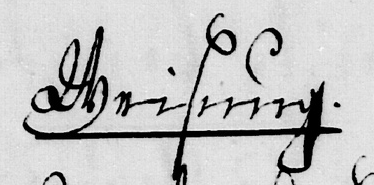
Weisung.
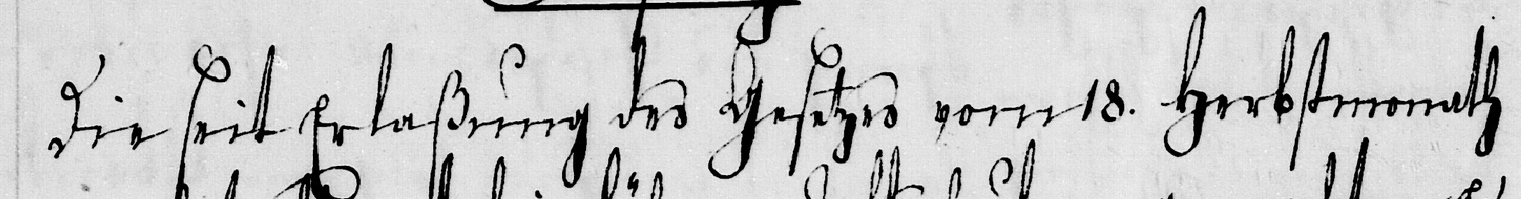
Die seit Erlaßung des Gesetzes vom 18. Herbstmonath
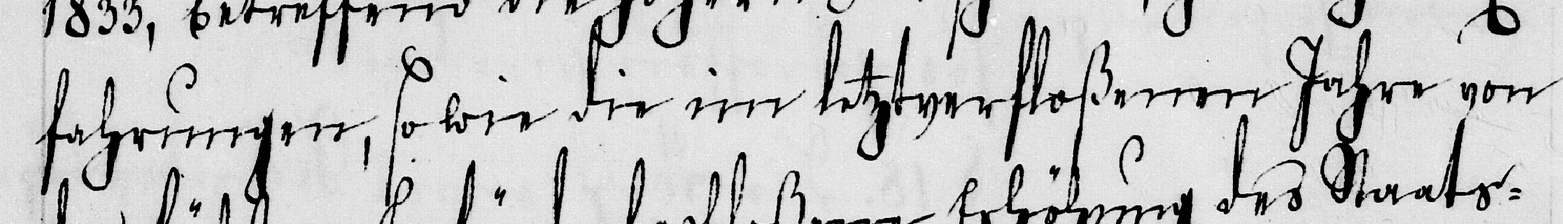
fahrungen, sowie die im letztverfloßenen Jahre von
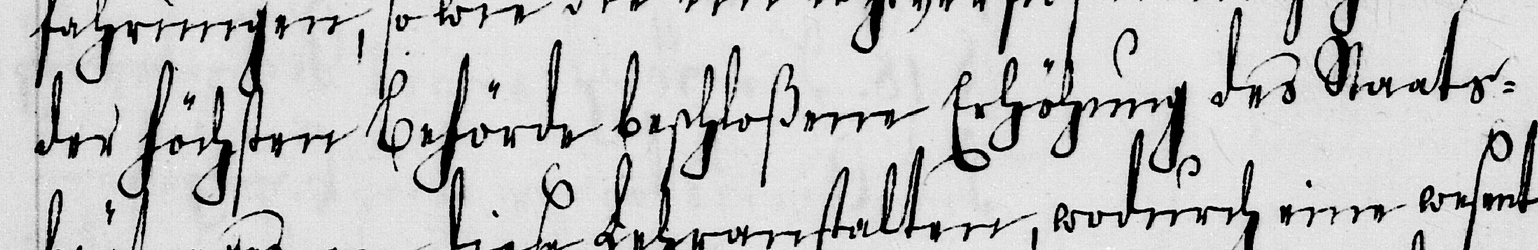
der Höchsten Behörde beschloßene Erhöhung des Staats¬
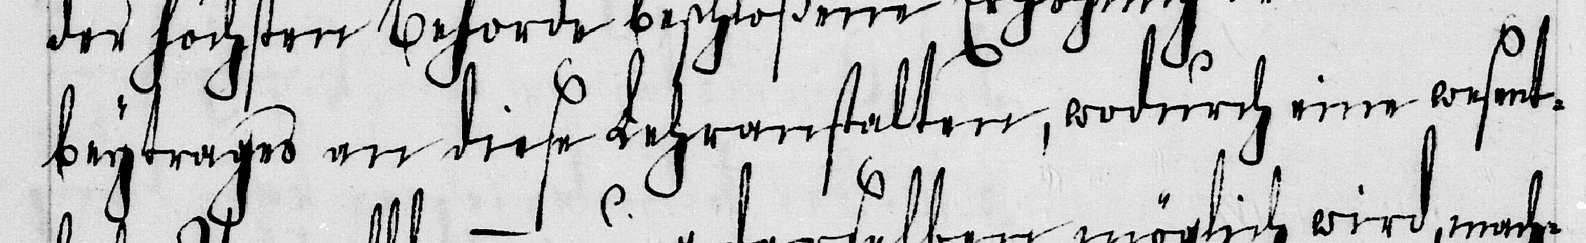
beytrages an diese Lehranstalten, wodurch eine wesent¬
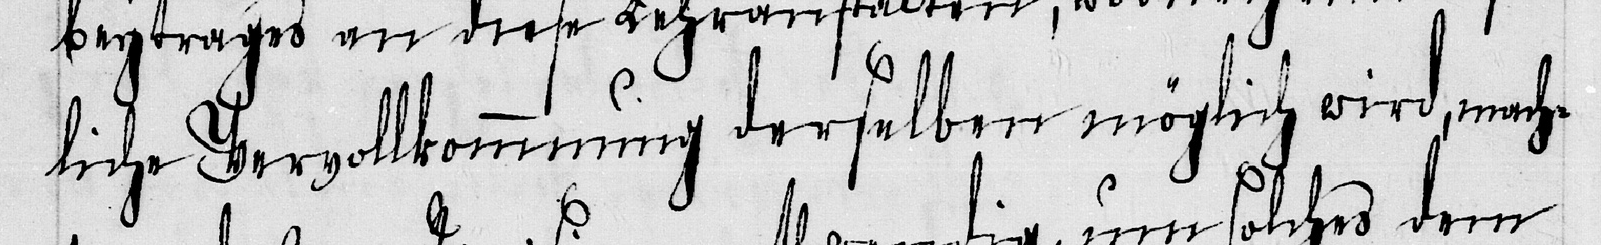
liche Vervollkommnung derselben möglich wird, mach¬
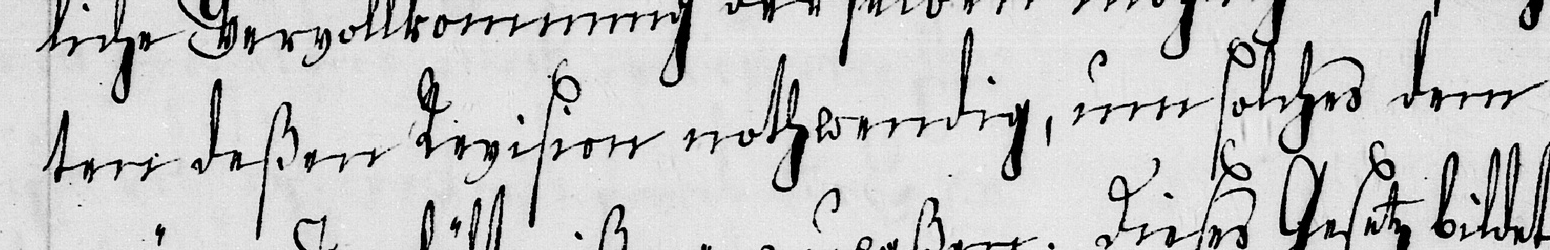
ten deßen Revision nothwendig, um solches dem
